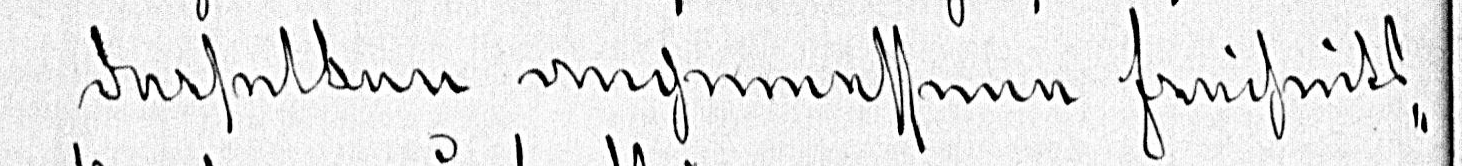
derselben angemessene Freiheits¬
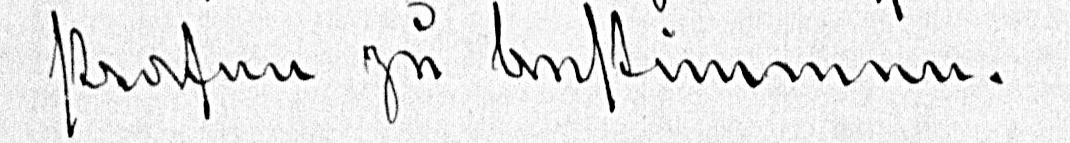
strafen zu bestimmen.
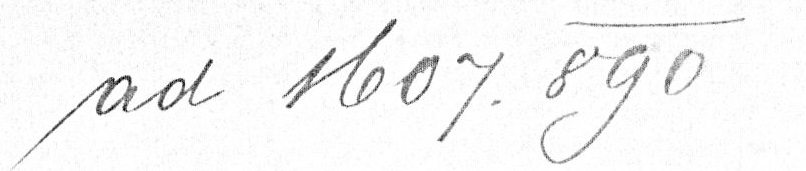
ad 1607.890
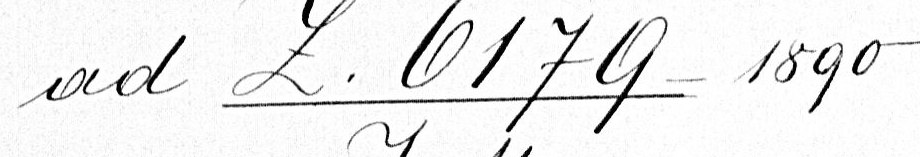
ad Z.6179/-1890
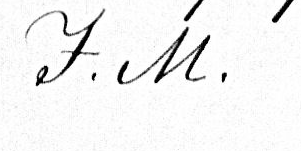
J.M.
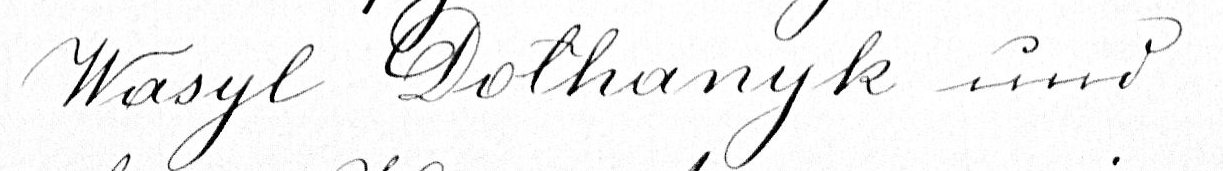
Wasyl Dothanyk und
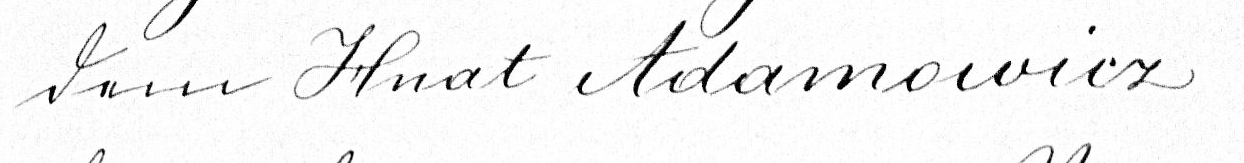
dem Hnat Adamowicz
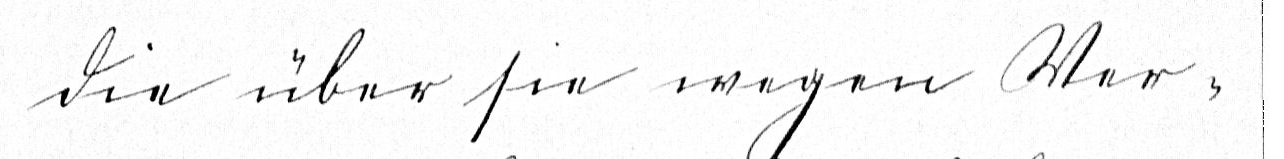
die über sie wegen Ver¬
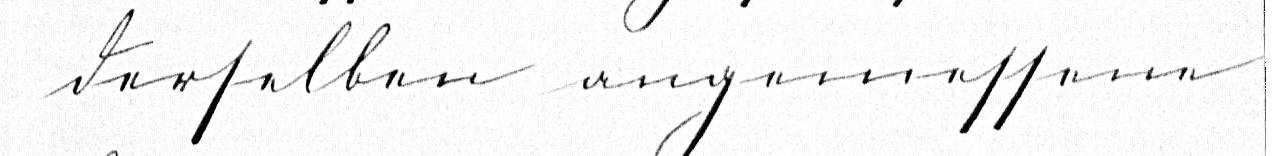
derselben angemessene
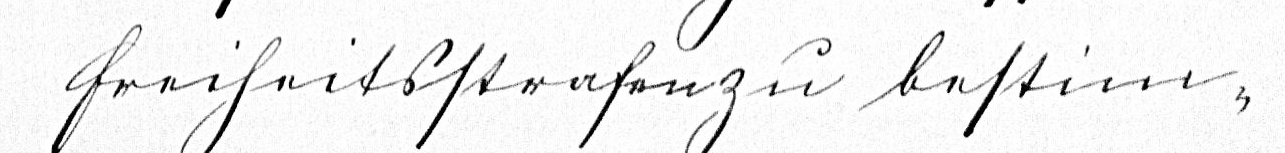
Freiheitsstrafen zu bestim¬
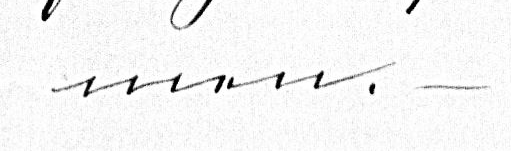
men.–
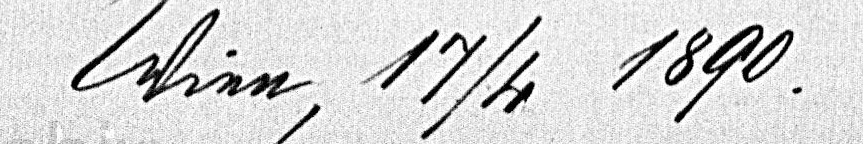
Wien, 17/4 1890.
